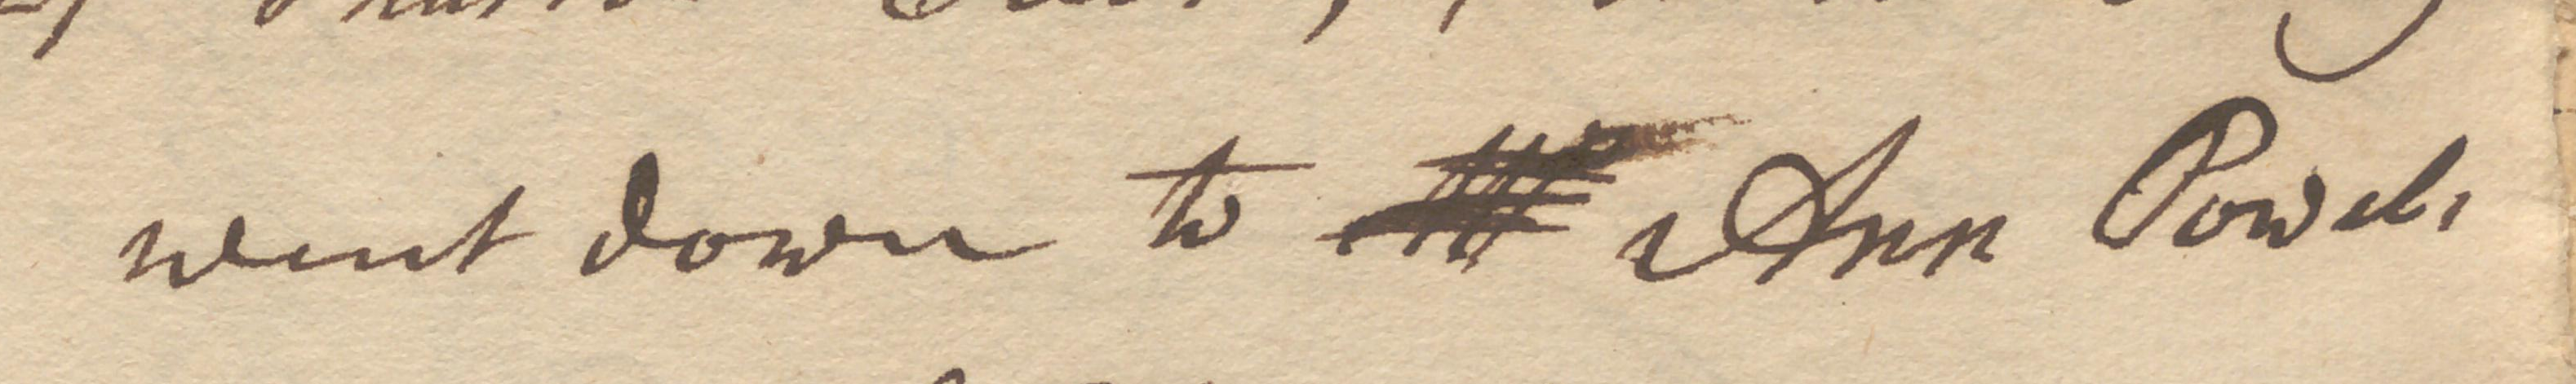went down to [M^r] Ann Powels
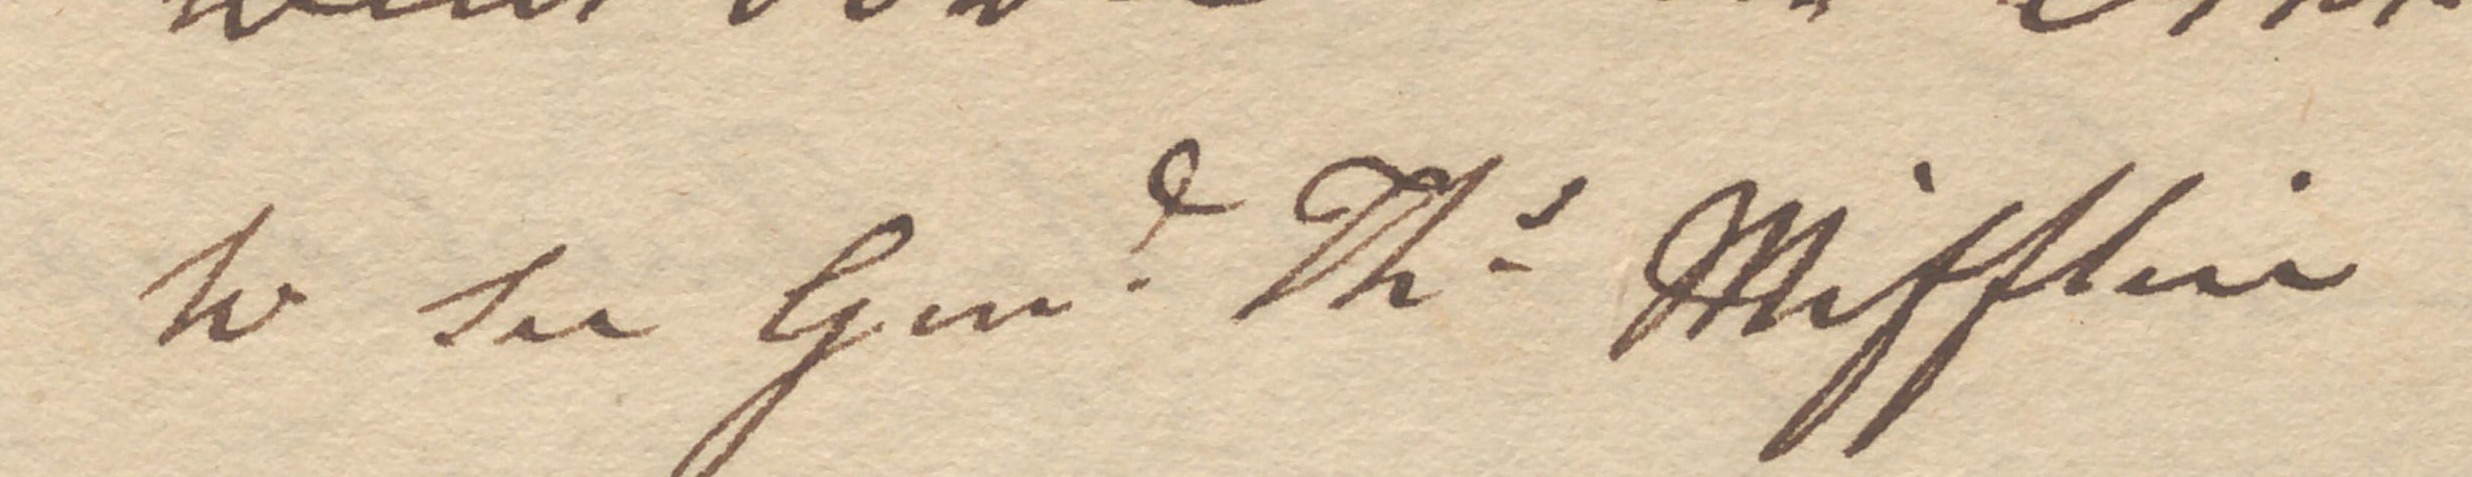to see Gen^l. Th^s. Mifflin
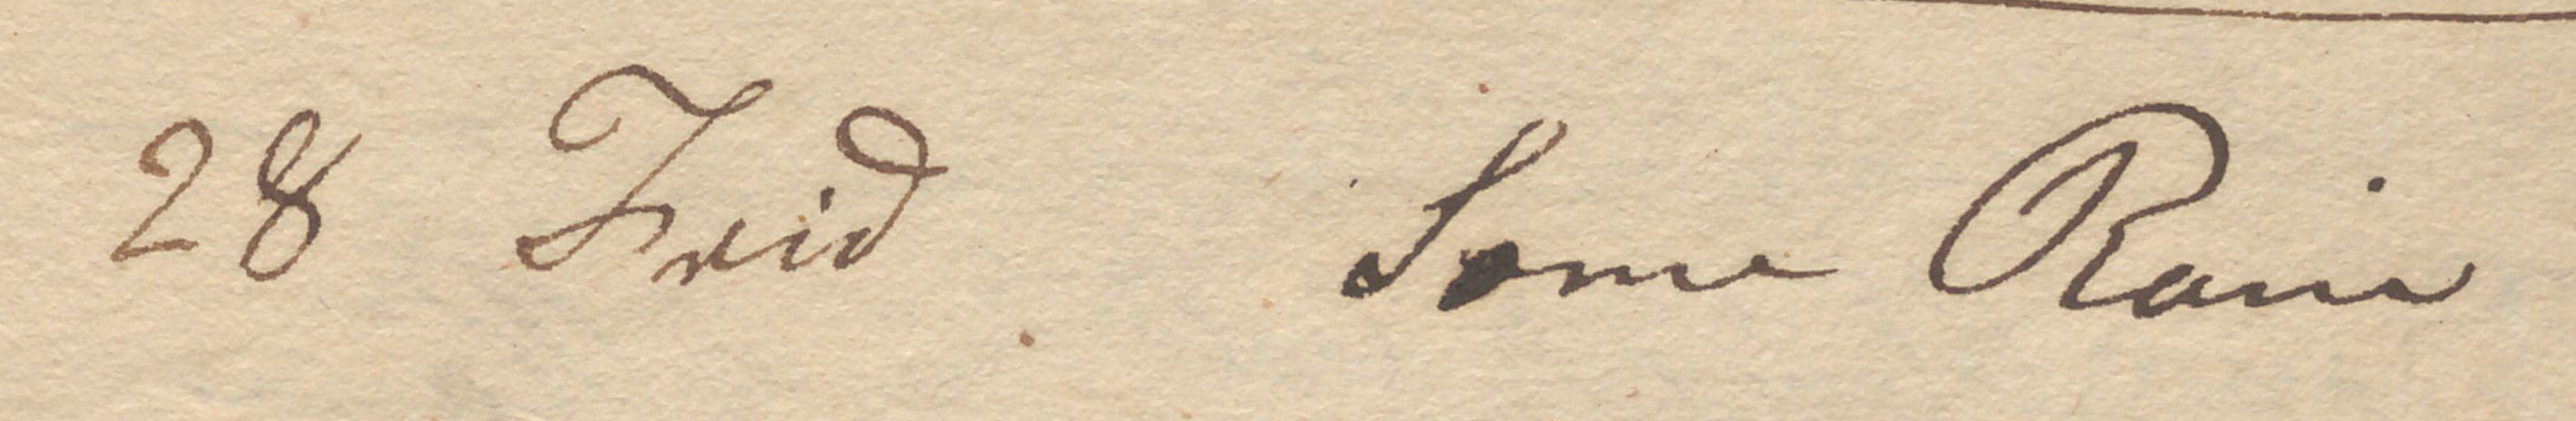28 Frid some Rain
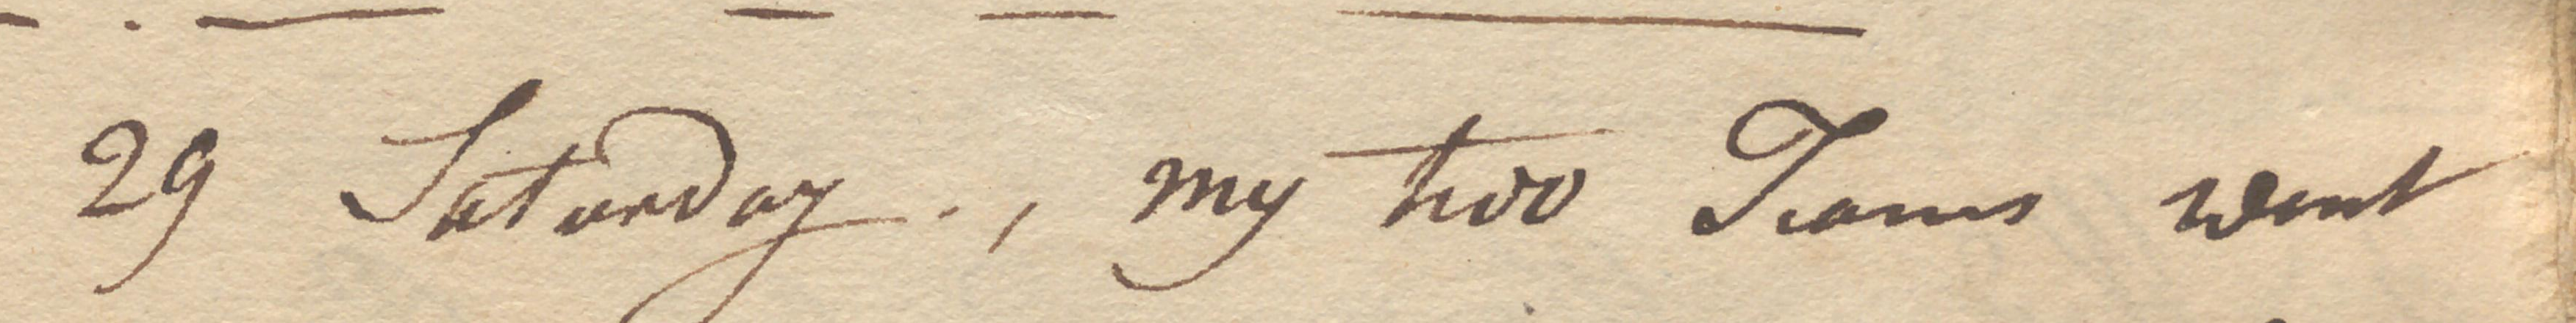29 Saturday, my two Teams went
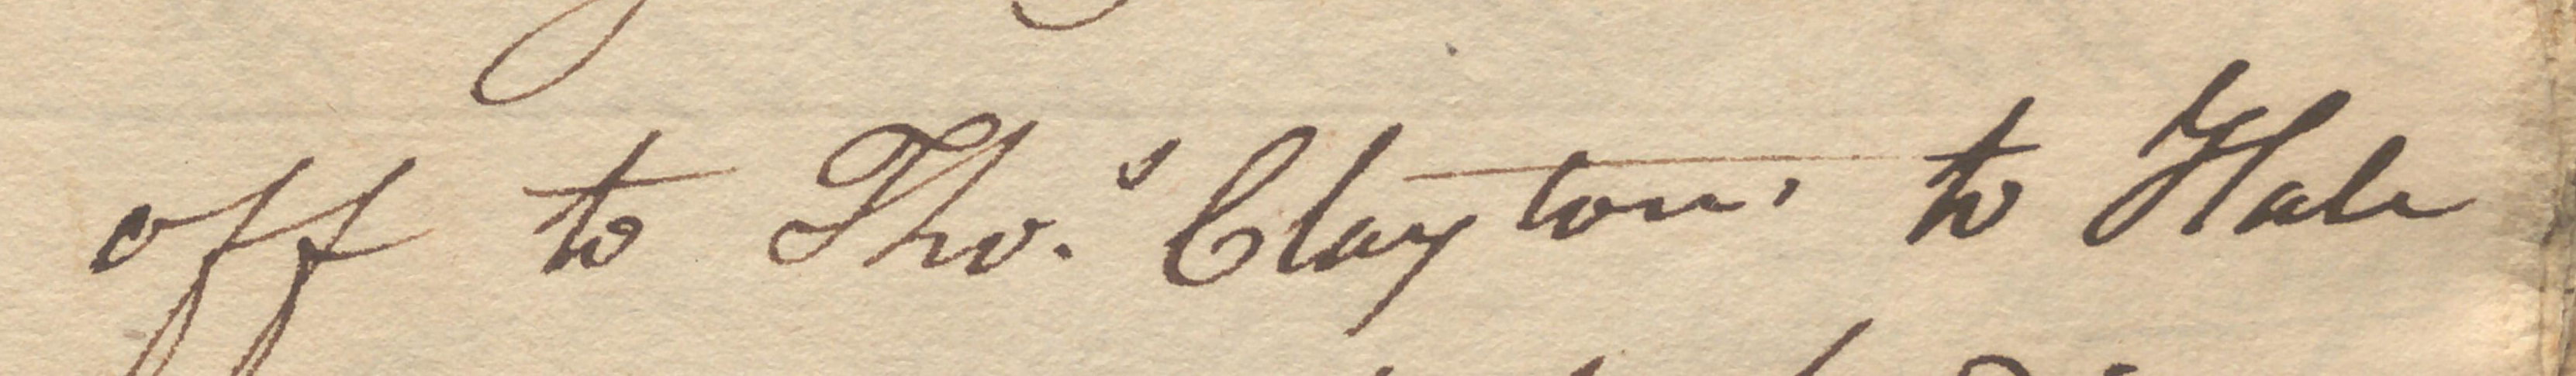off to Tho^s. Claytons to Hale
